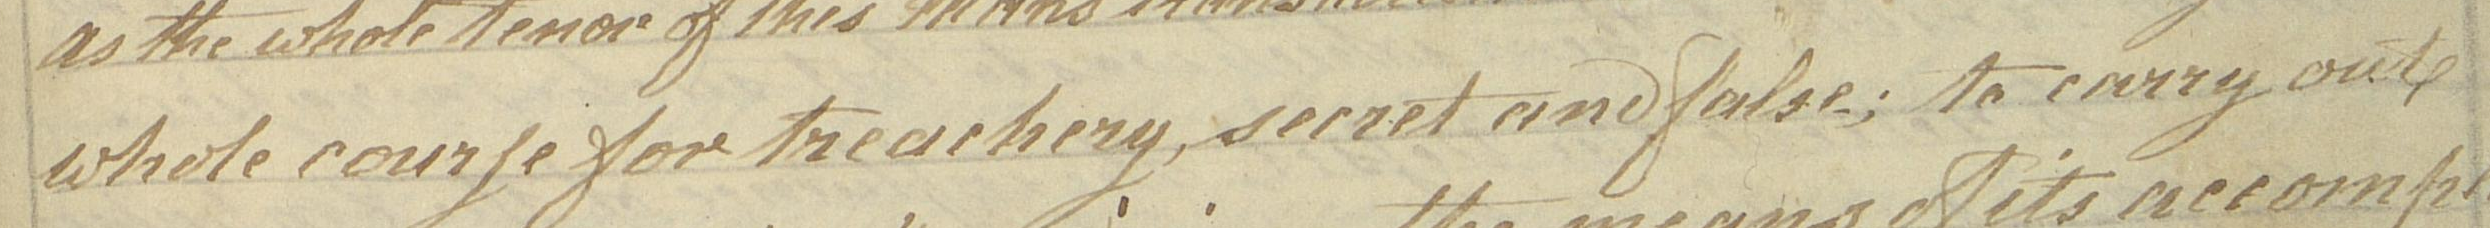whole course for treachery, secret and false; to carry out
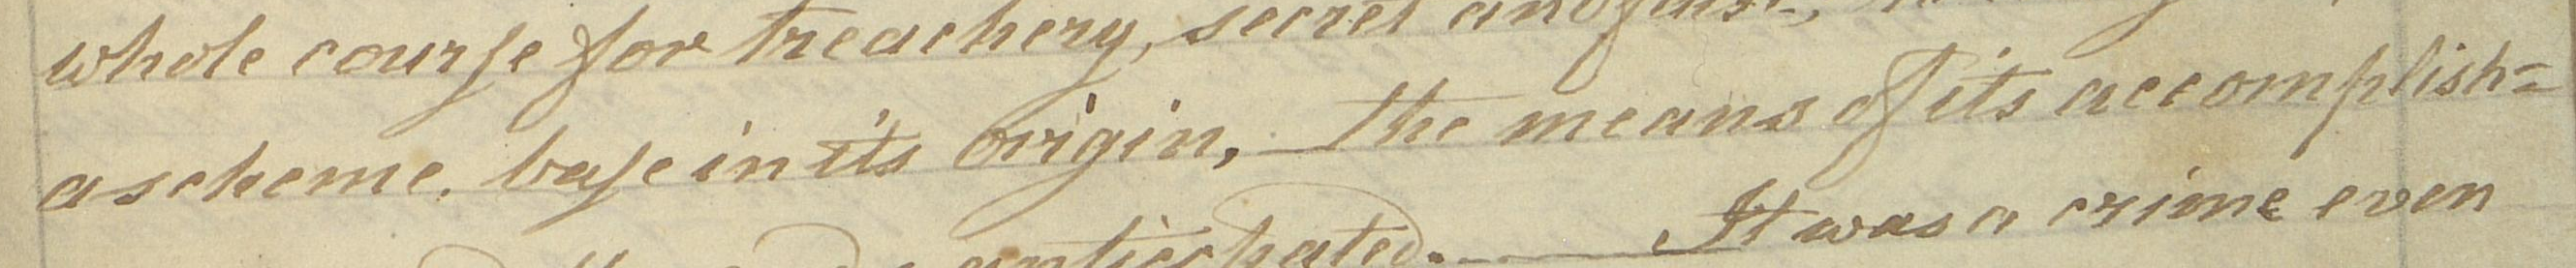a scheme base in its Origin, the means of its accomplish-
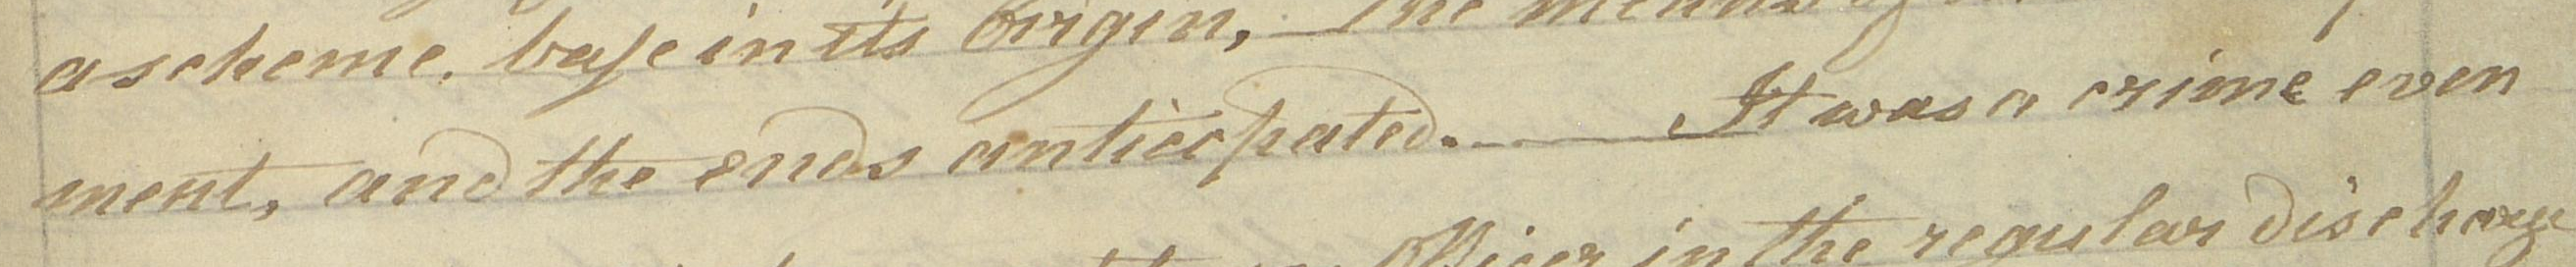-ment, and the ends anticpated. It was a crime even
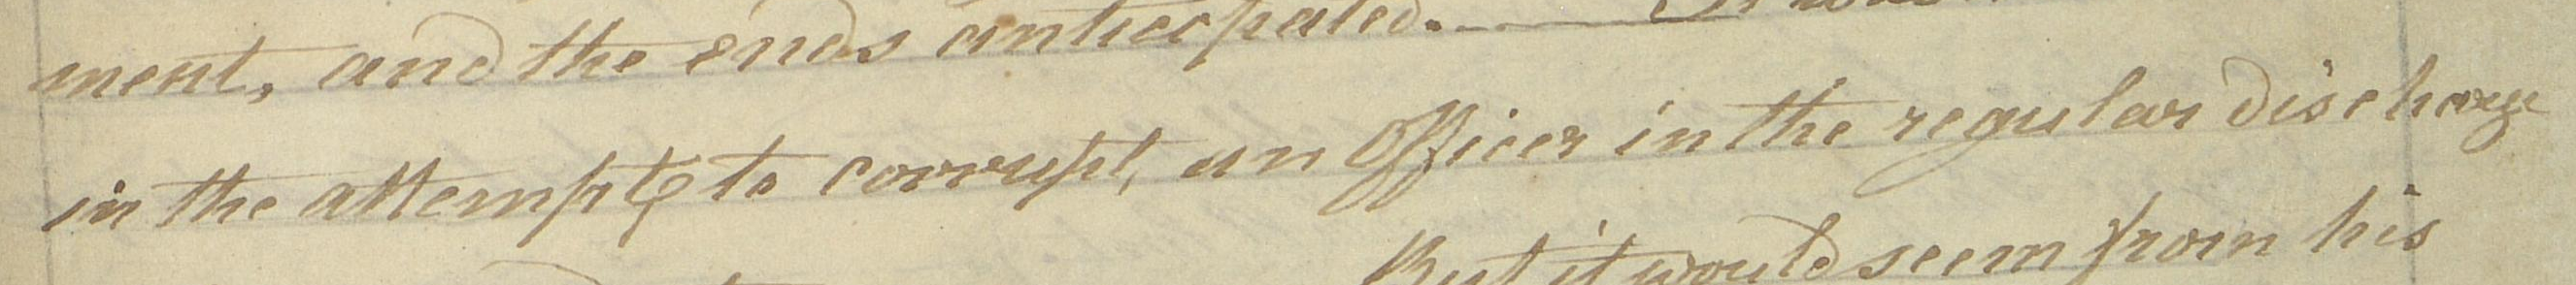in the attempt to corrupt, an office in the regular discharge
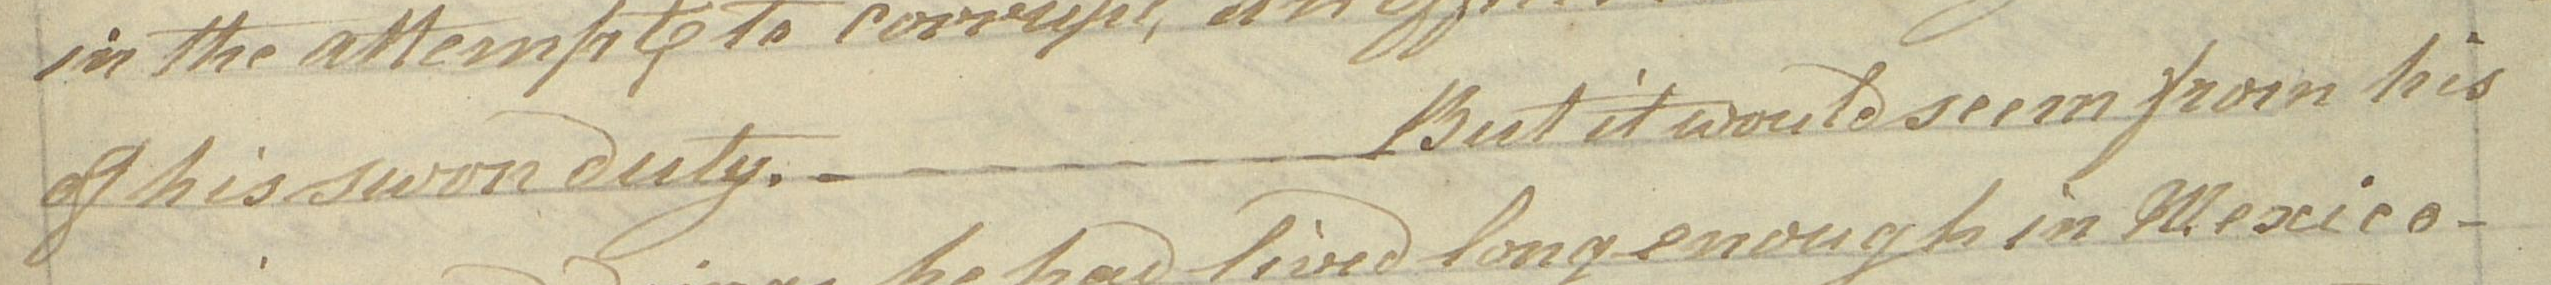of his swon duty. But it would seem from his
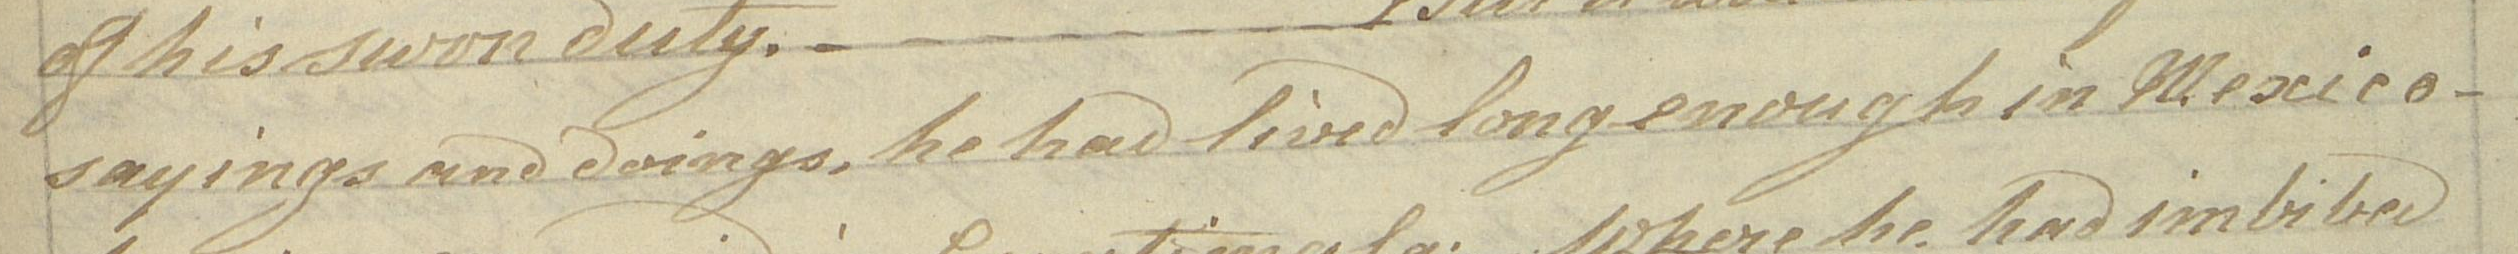sayings and doings he had lived long enough in Mexico.
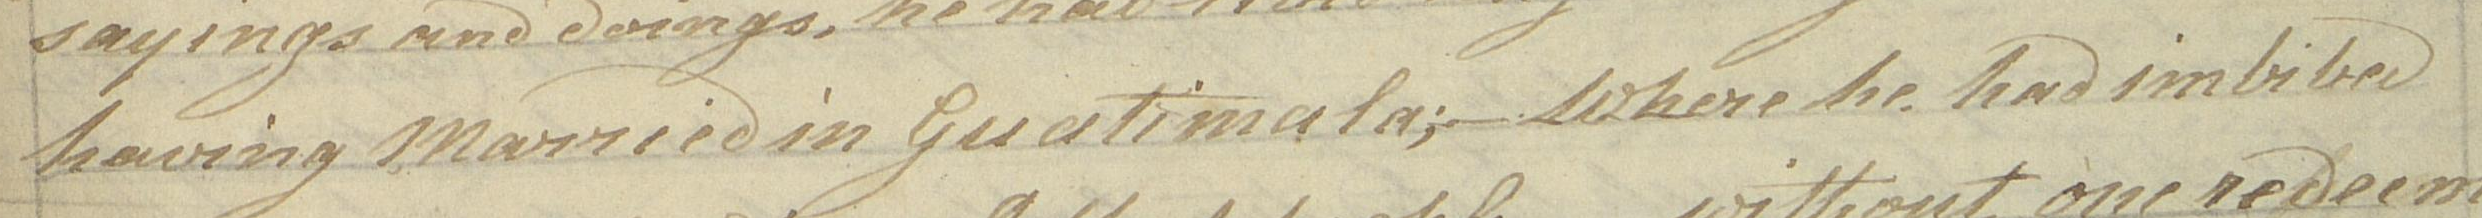having married in Guatimala; where he had imbibed
